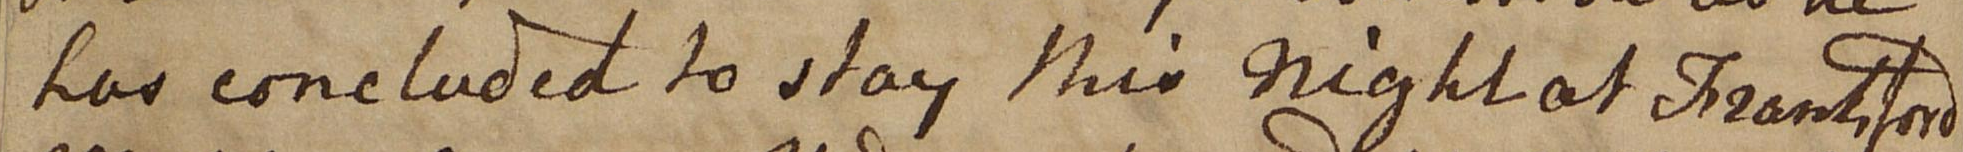has concluded to stay this night at Frankford
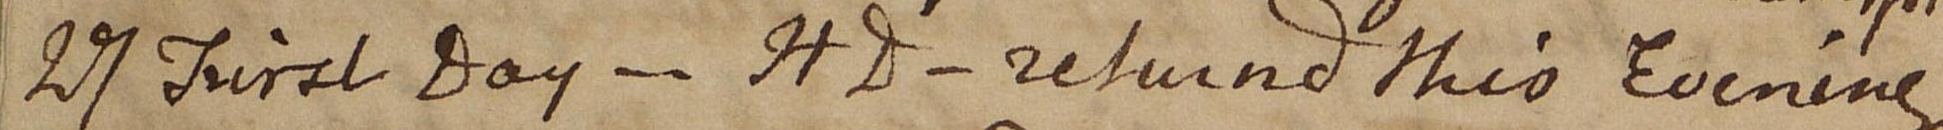27 First Day- HD- returnd this Evening
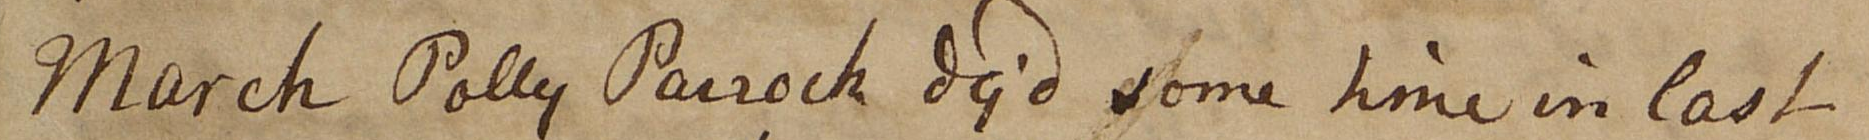March Polly Parrock dy'd some time in last
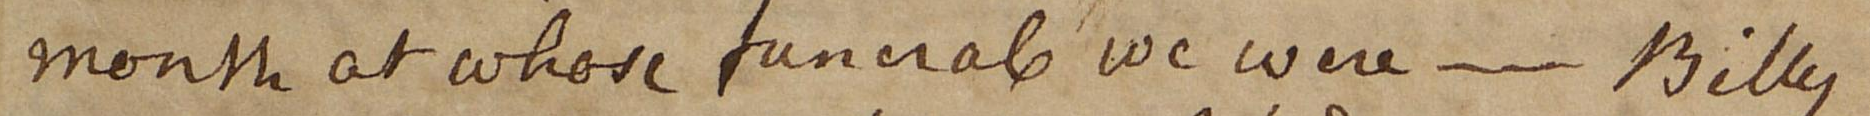month at whose funeral we were- Billy
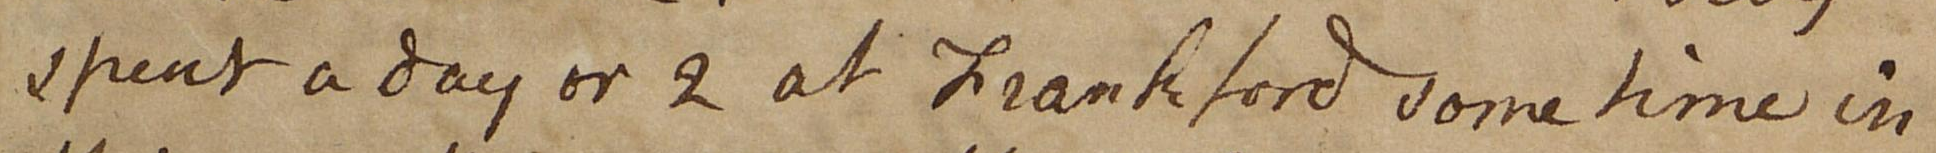spent a day or 2 at Frankford some time in
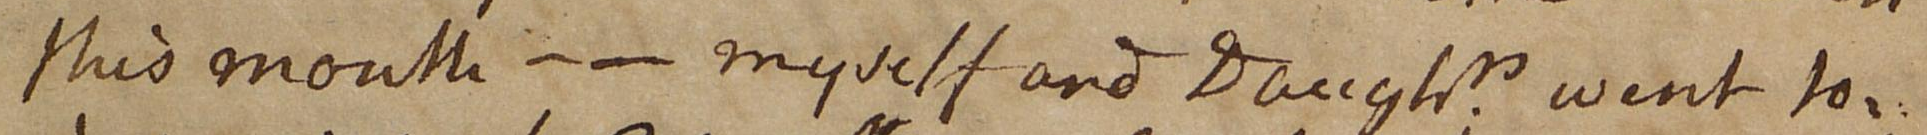this month-- myself and Daugh^r. went to,
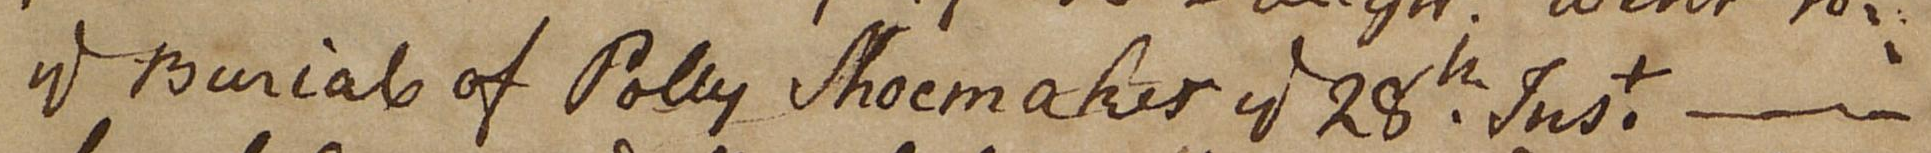y^e Burial of Polly Shoemaker y^e 28^th. Ins^t.-
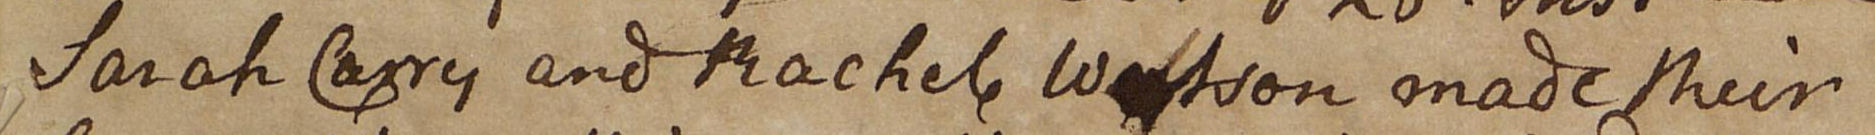Sarah Carry and Rachel Watson made their
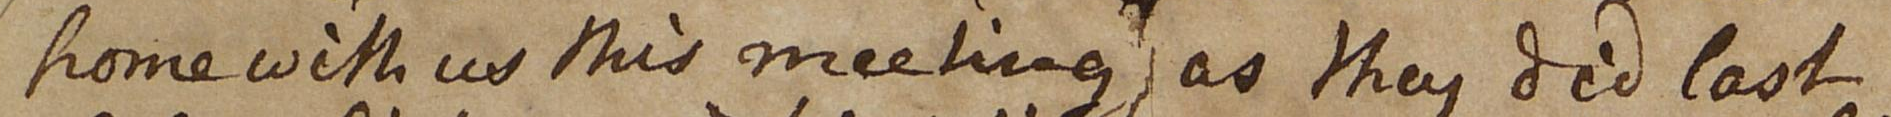home with us this meeting, as they did last
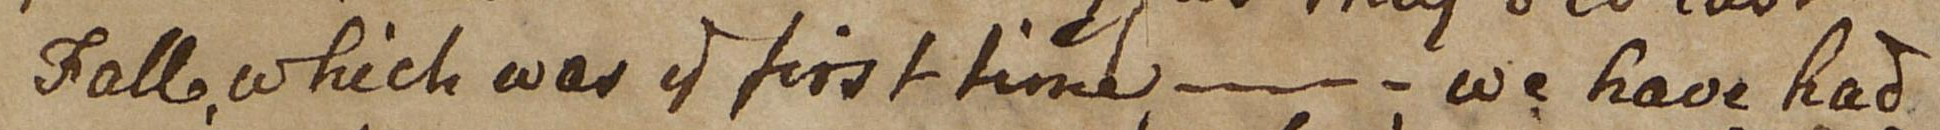Fall, which was y^e first time- we have had
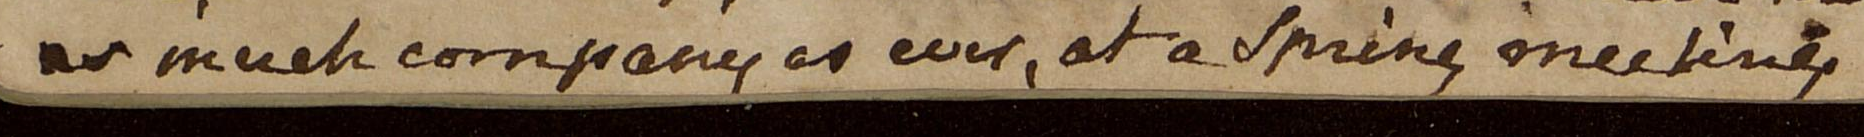a much company as ever, at a Spring meeting
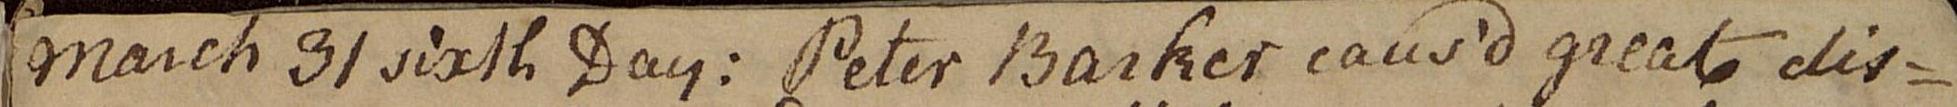March 31 sixth Day: Peter Barker caus'd great dis-
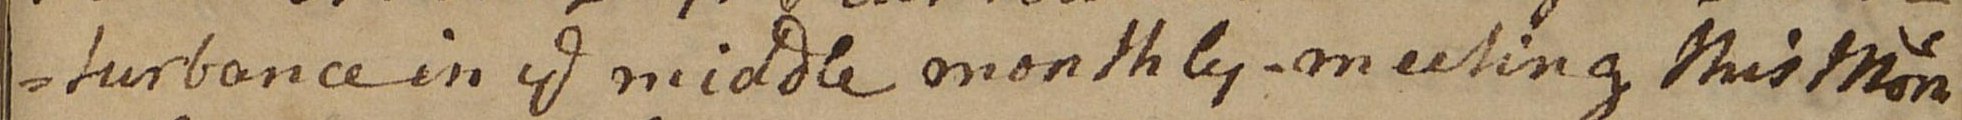-turbance in y^e middle monthly- meeting this Morn^g
